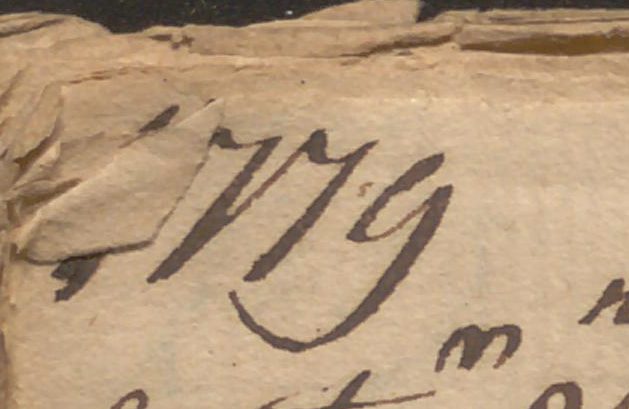1779
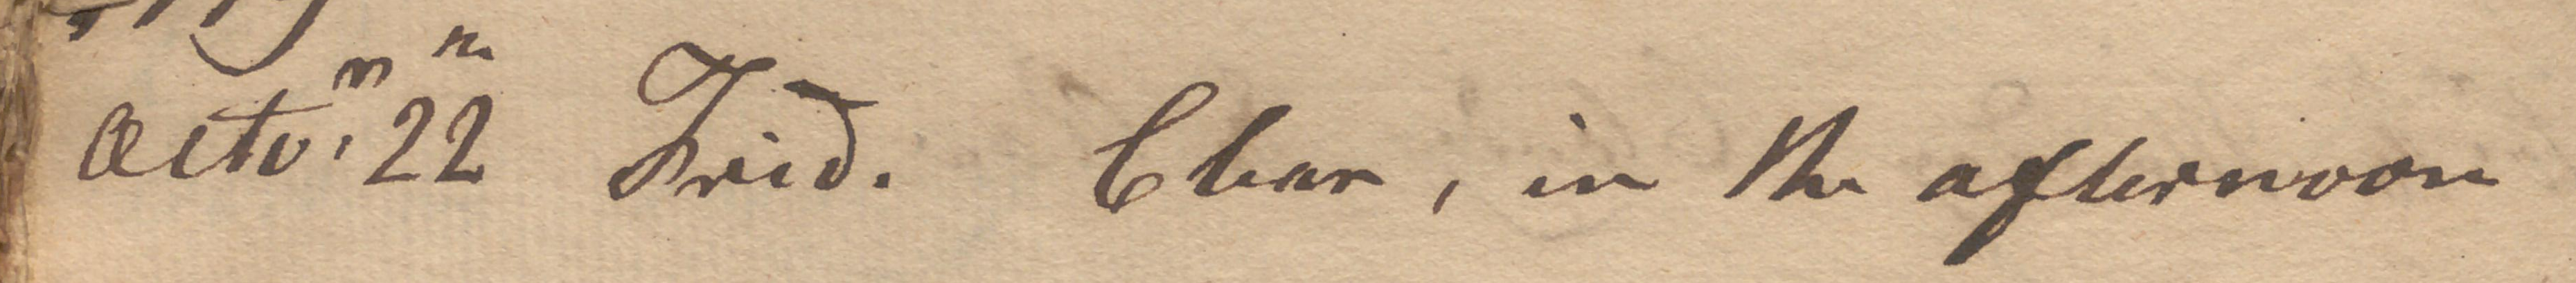Octo^r. 22^th Frid. Clear, in the afternoon
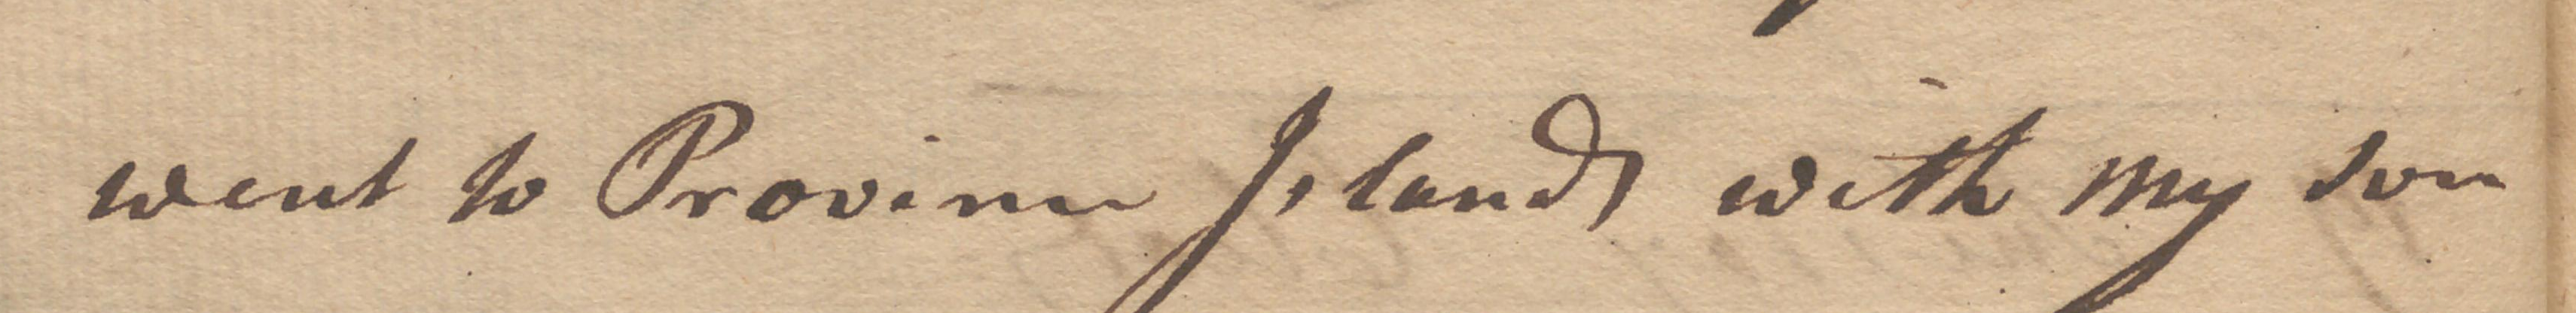went to Province Islands with my son
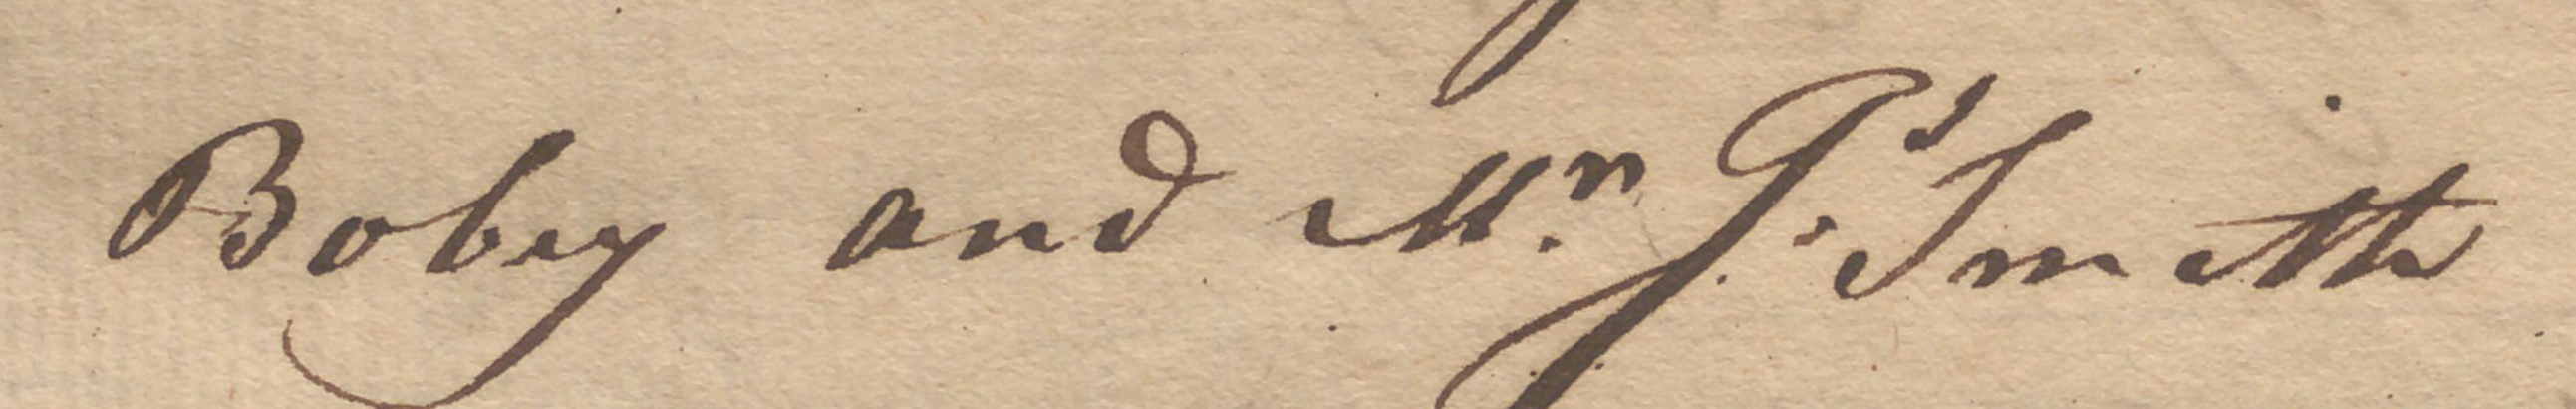Bobey and M^r. J^s. Smith
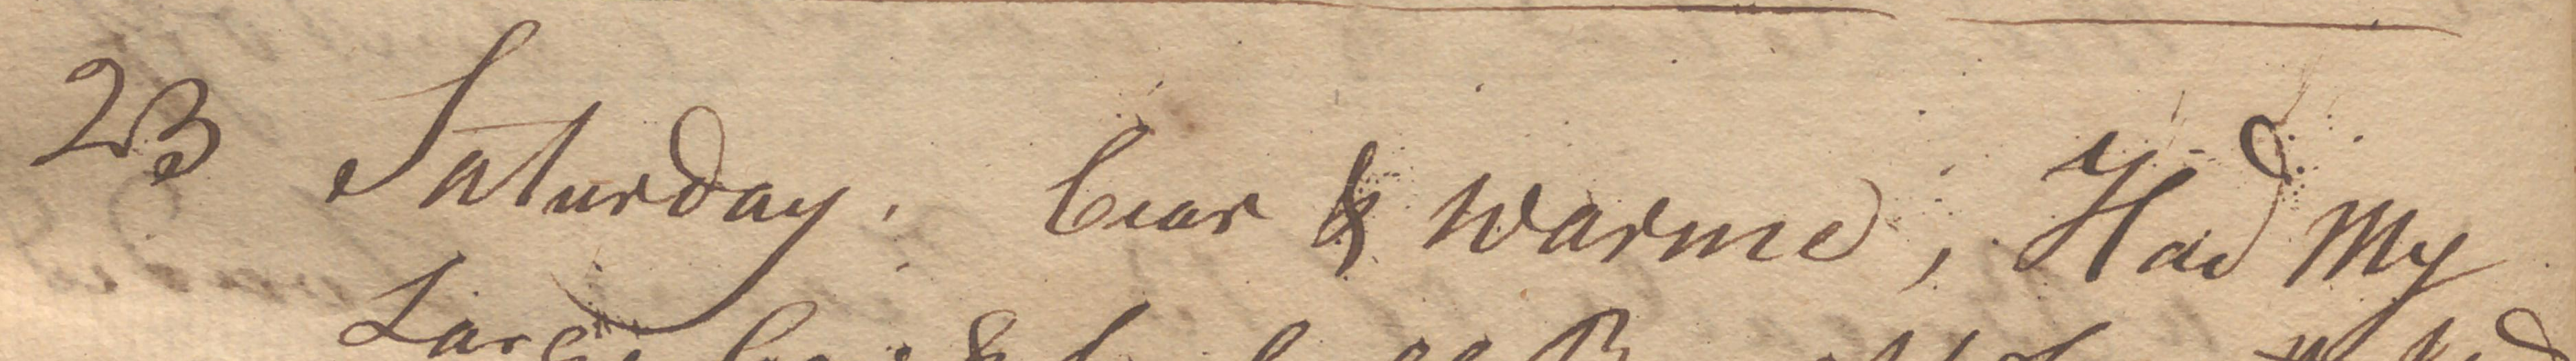23 Saturday. Clear & warme, Had My
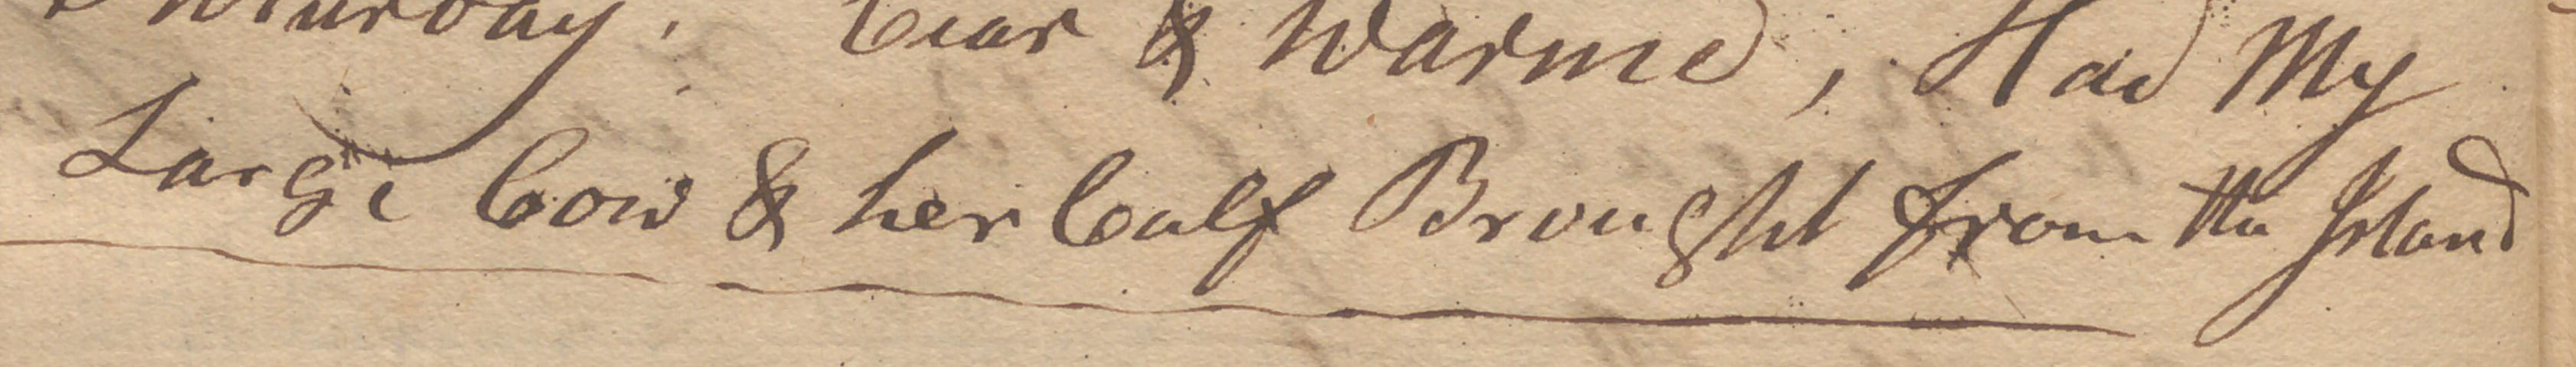Large Cow & her Calf Brought from the Island
